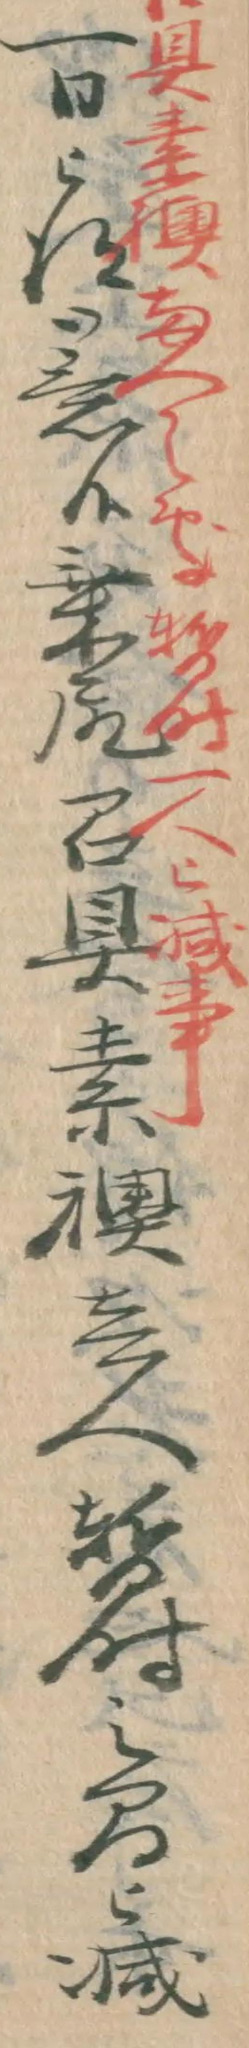一日被得御意候乗尻召具素襖壱人暫時之間被減
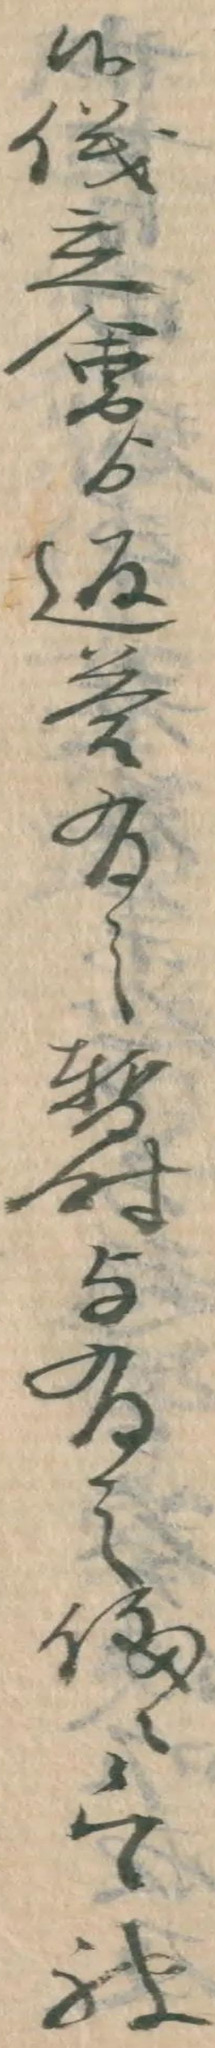候儀立会ゟ返答有之暫時与有之儀ニ候ハヽ被
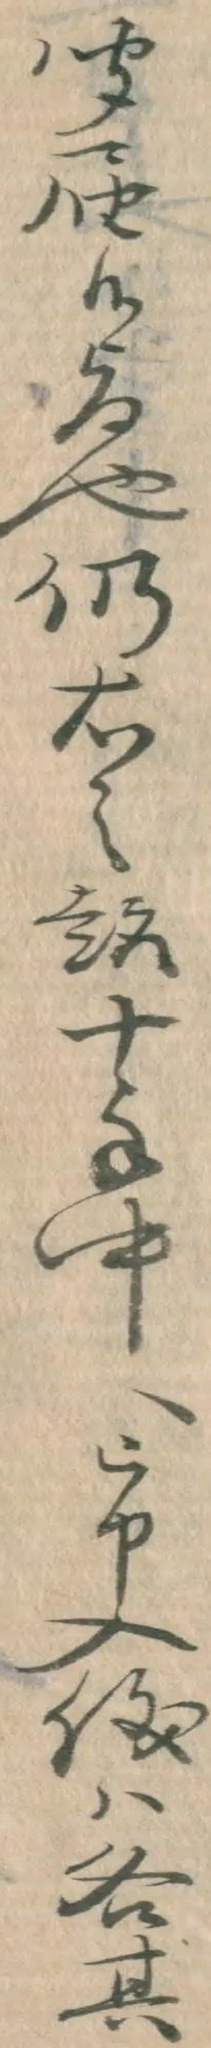聞届候旨也仍右之趣十手中へ被申入儀ハ各其
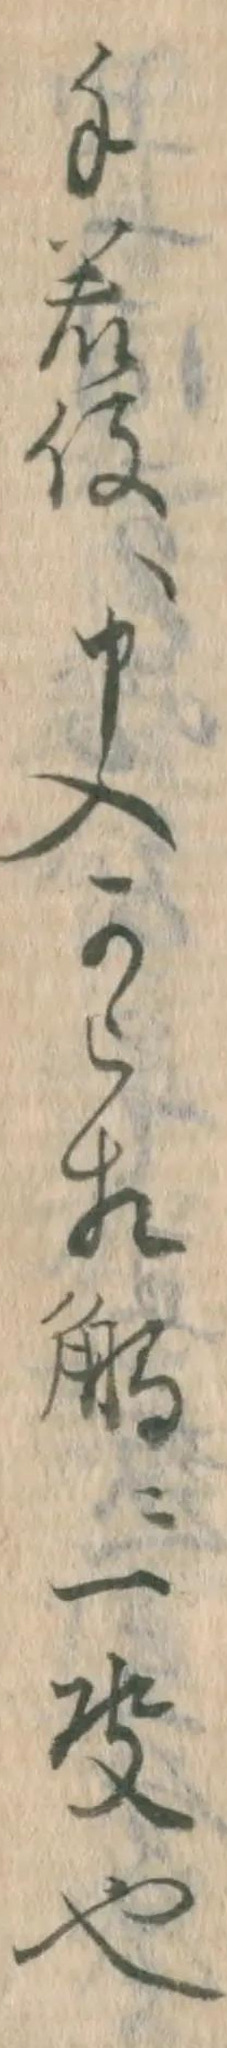手若役へ申入可被相触ニ一決也
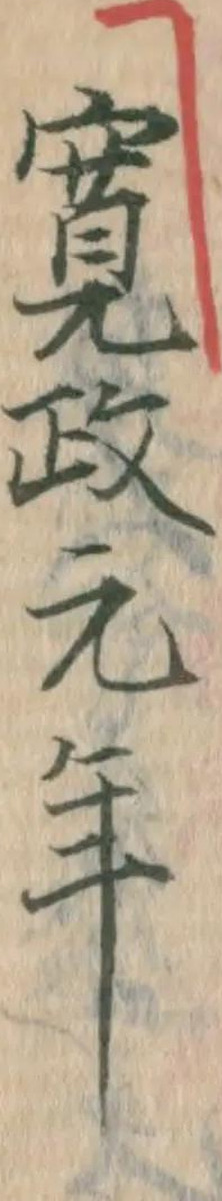寛政元年
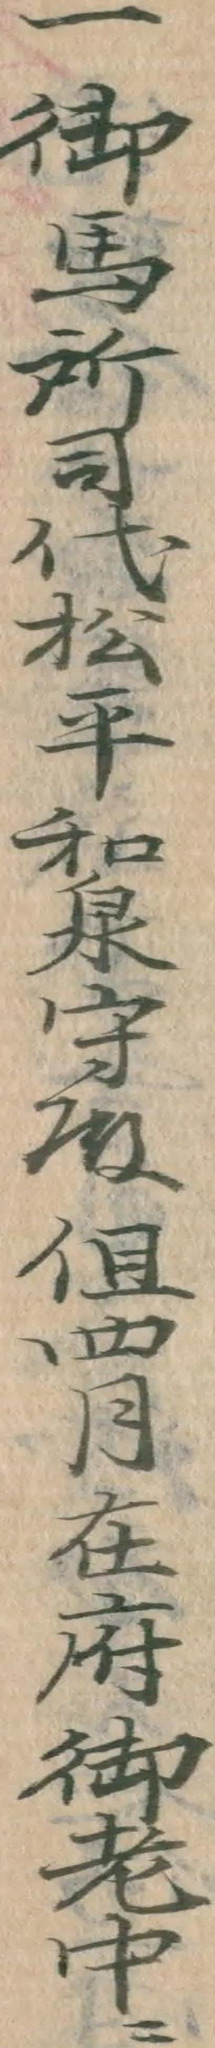一御馬所司代松平和泉守殿但四月在府御老中ニ
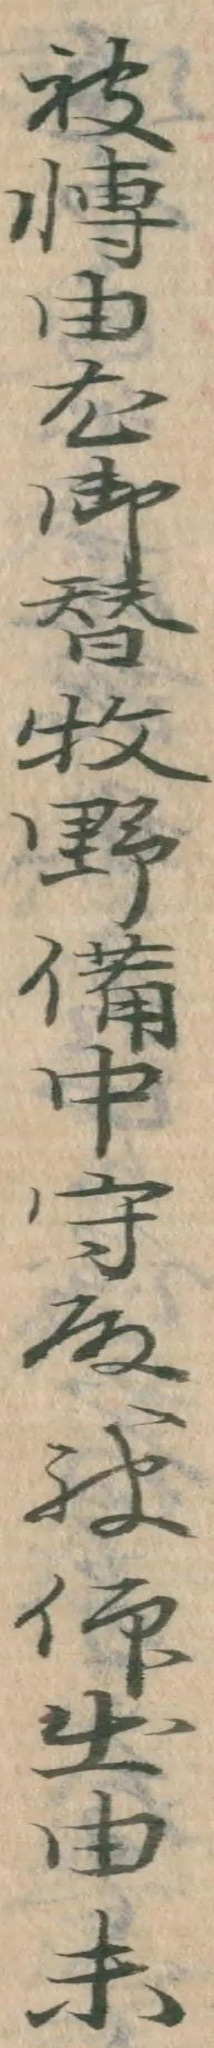被転由尤御替牧野備中守殿へ被仰出由未
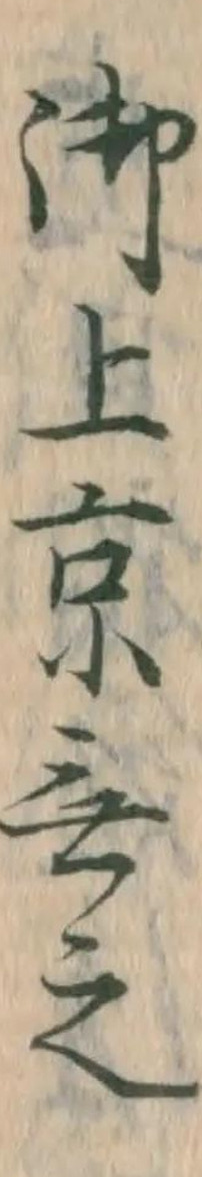御上京無之
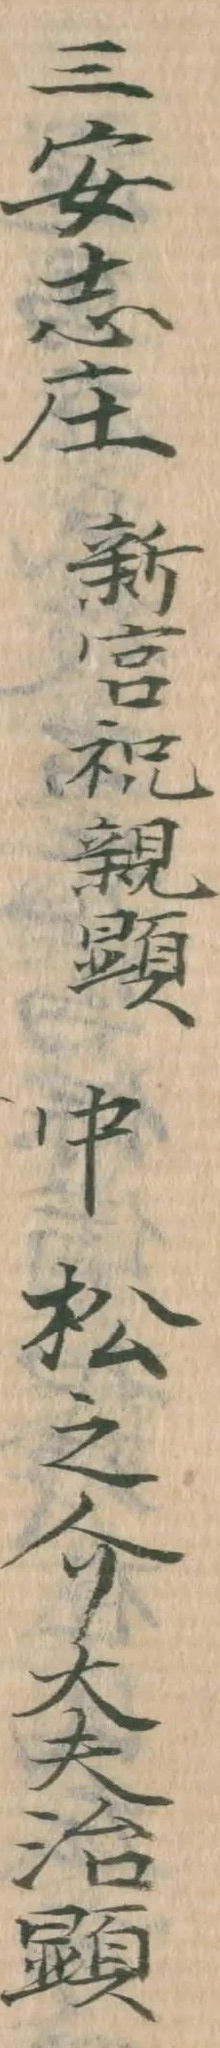三安志庄新宮祝親顕中松之介大夫治顕
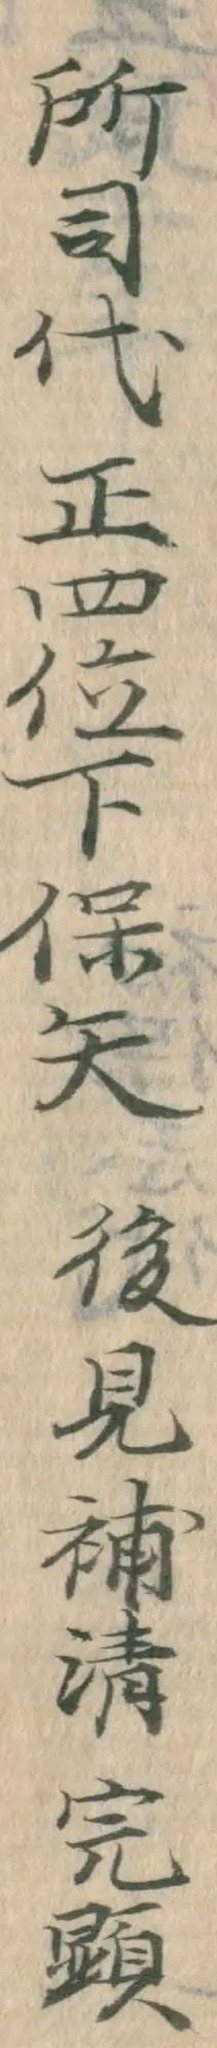所司代正四位下保矢後見補清完顕
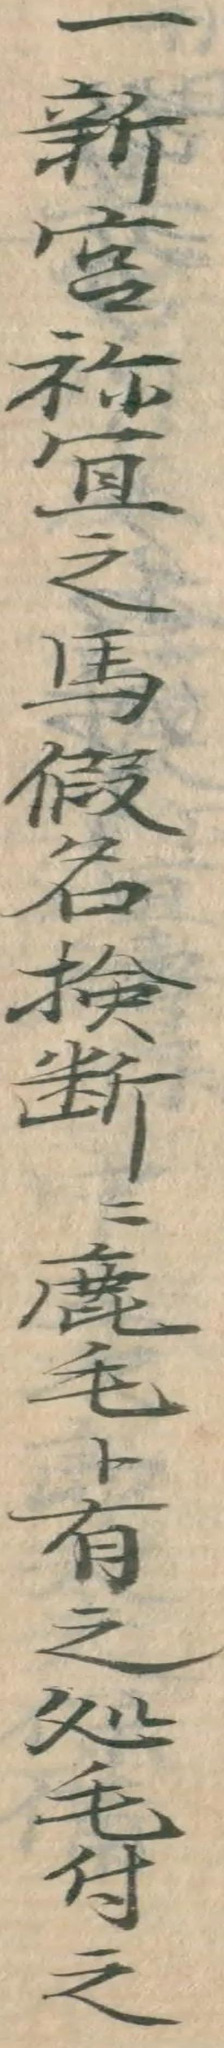一新宮祢宜之馬仮名検断ニ鹿毛ト有之処毛付之
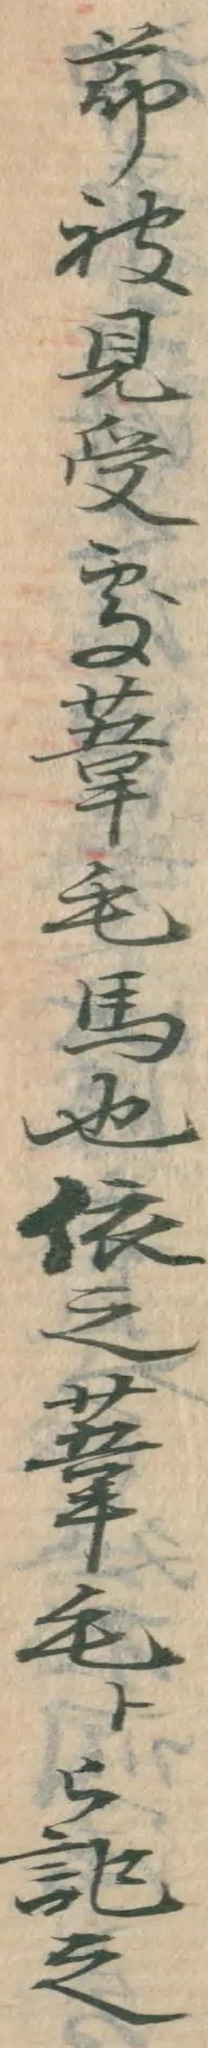節被見受処葦毛馬也依之葦毛ト被記之

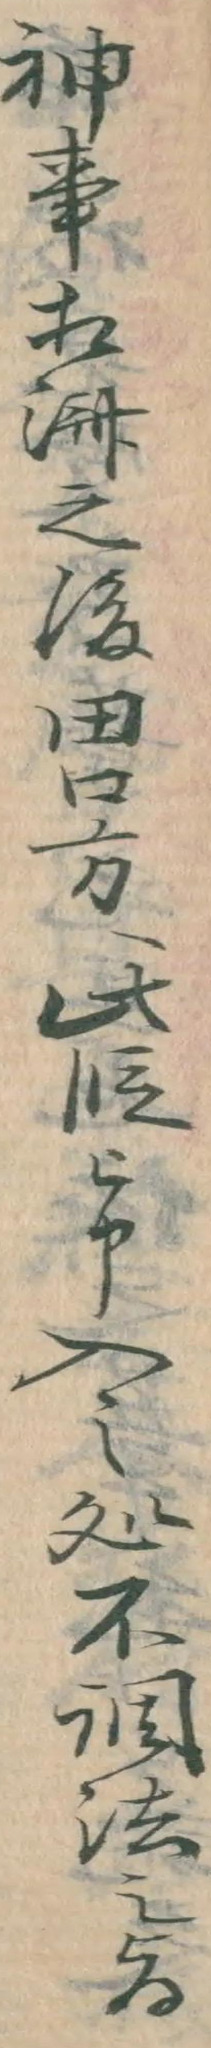神事相済之後田口方へ此段被申入之処不調法之旨
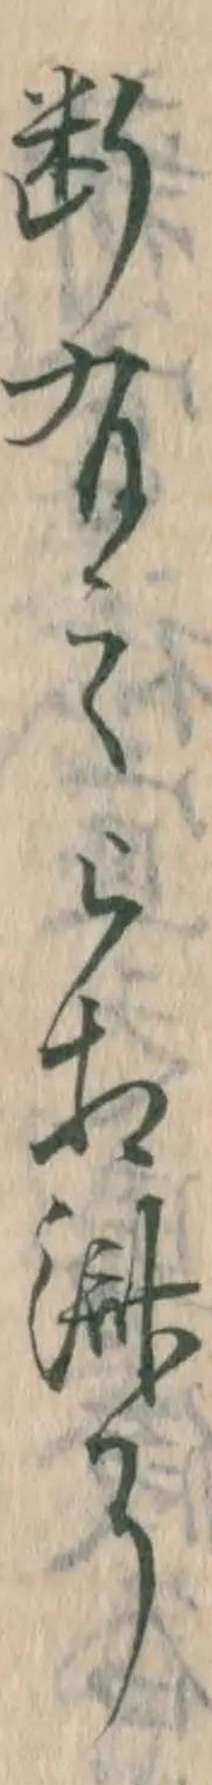断有之被相済了
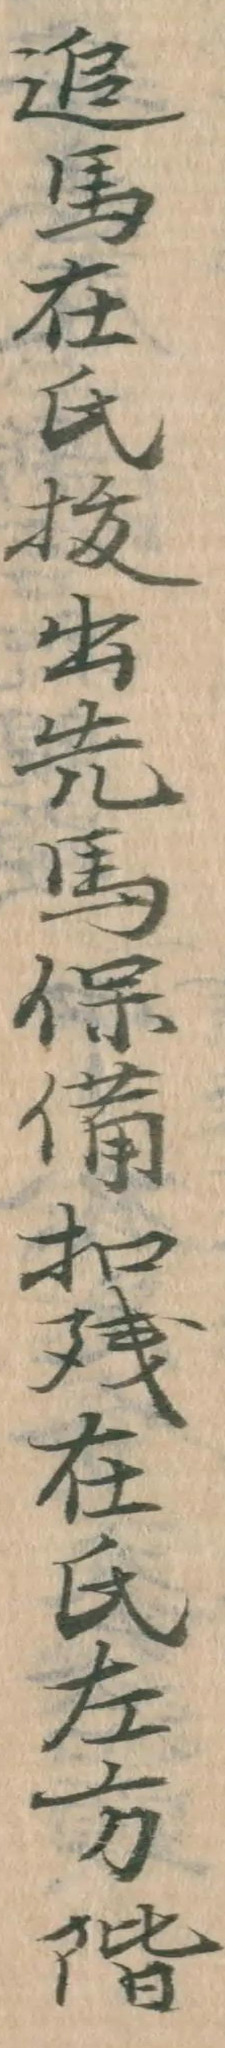追馬在氏抜出先馬保備扣残在氏左方階
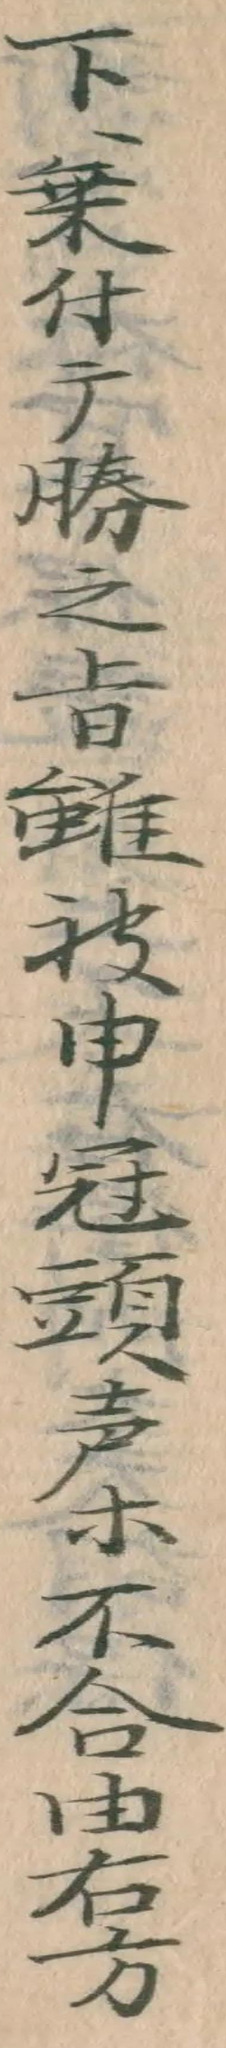下ヘ乗付テ勝之旨雖被申冠頭声等不合由右方
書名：賀茂社記録. 第10冊
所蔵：国立国会図書館 National Diet Library, JAPAN
